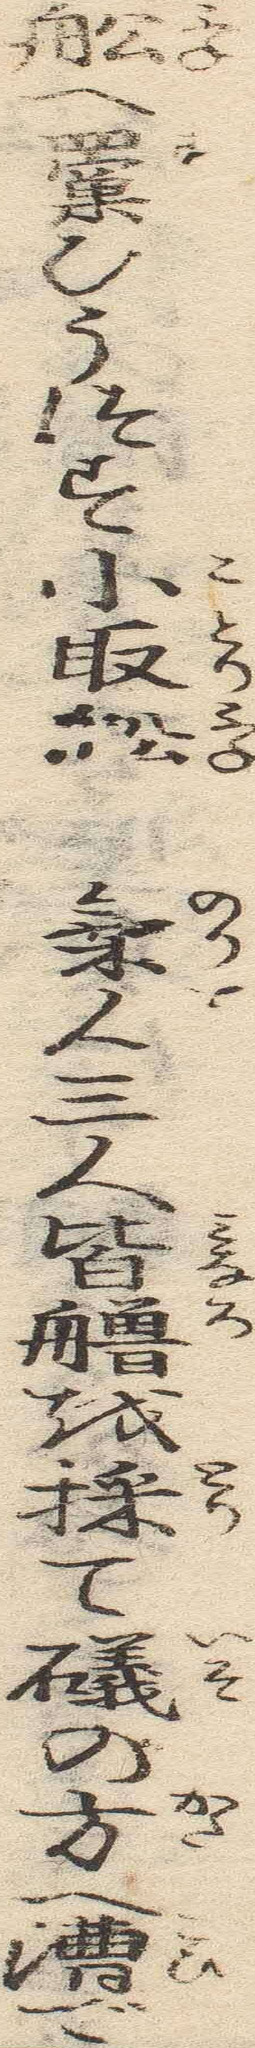船へひうつす小取船乗人三人皆艪を採て礒の方へ漕で
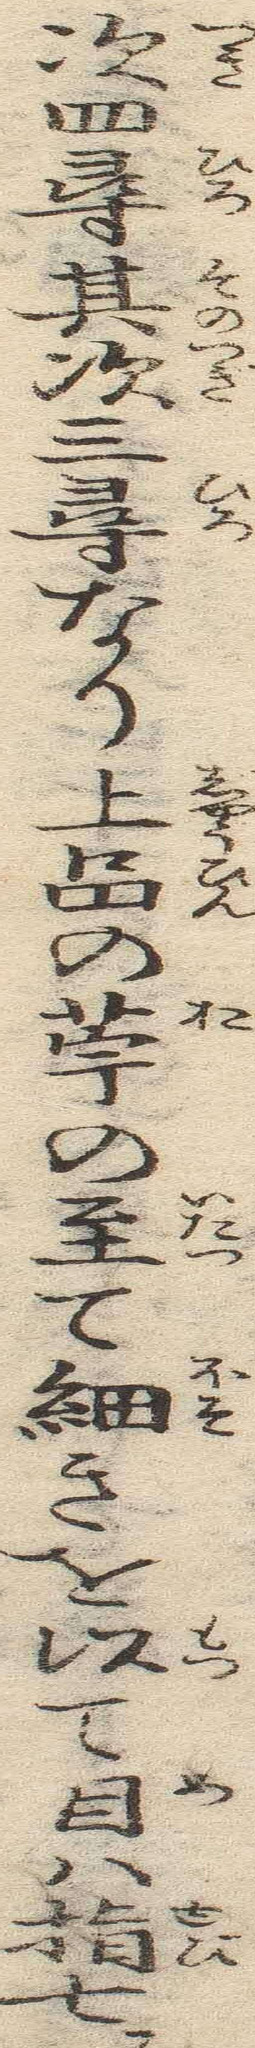次四尋其次三尋なり上品のの至て細きを以て目は指七ッ
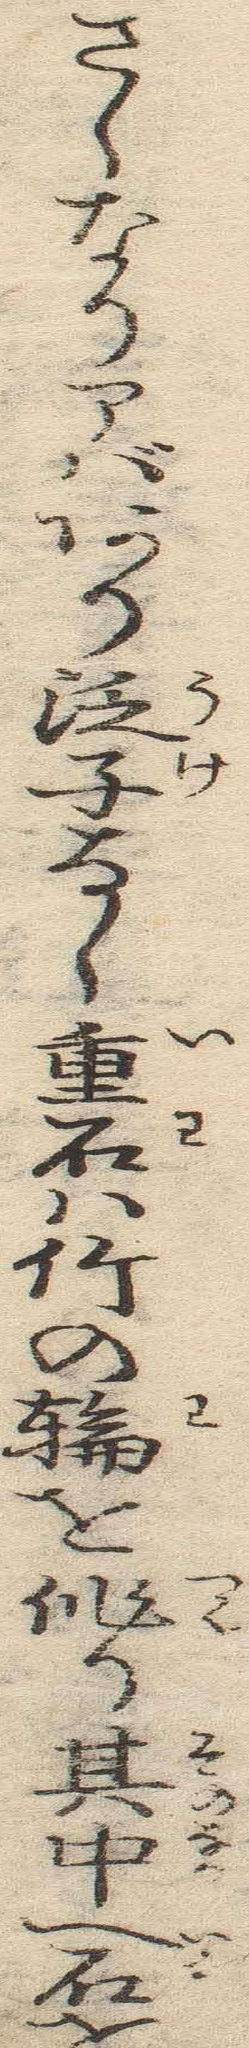さしなりアバあり泛子なし重石は竹の輪を作り其中へ石を
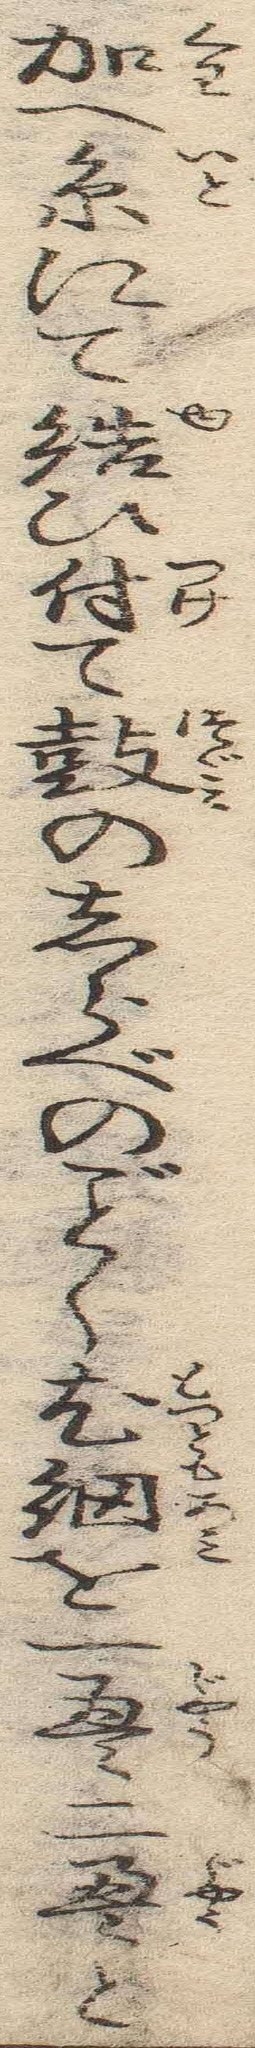加へ糸にて結ひ付て鼓のしらべのごとく尤網を一畳二畳と
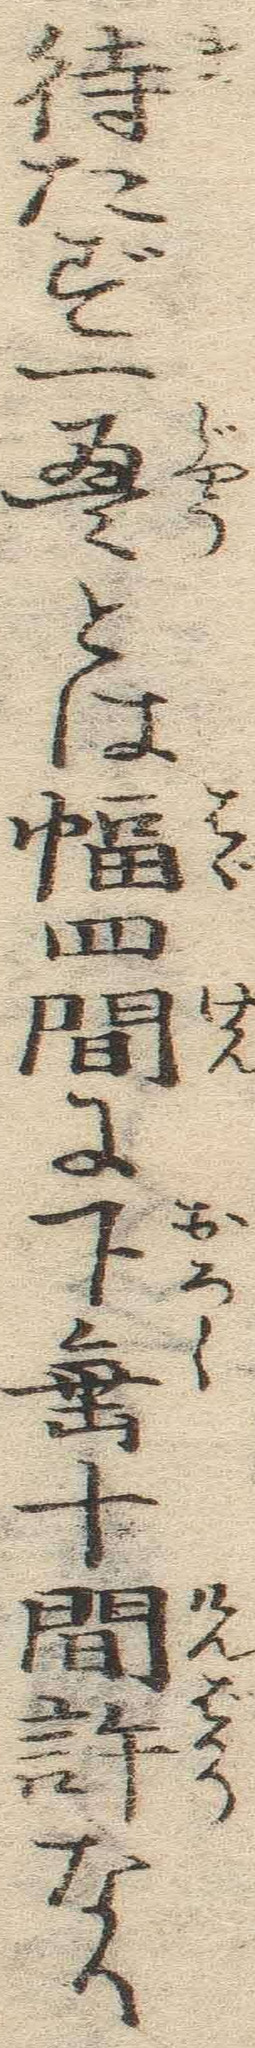待たず一畳とは幅四間に下垂十間許なり
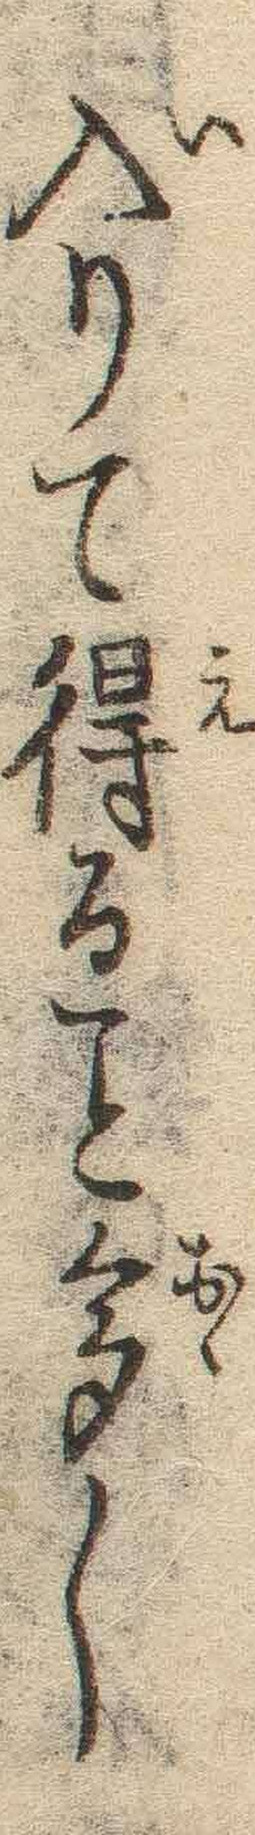入りて得ること多し

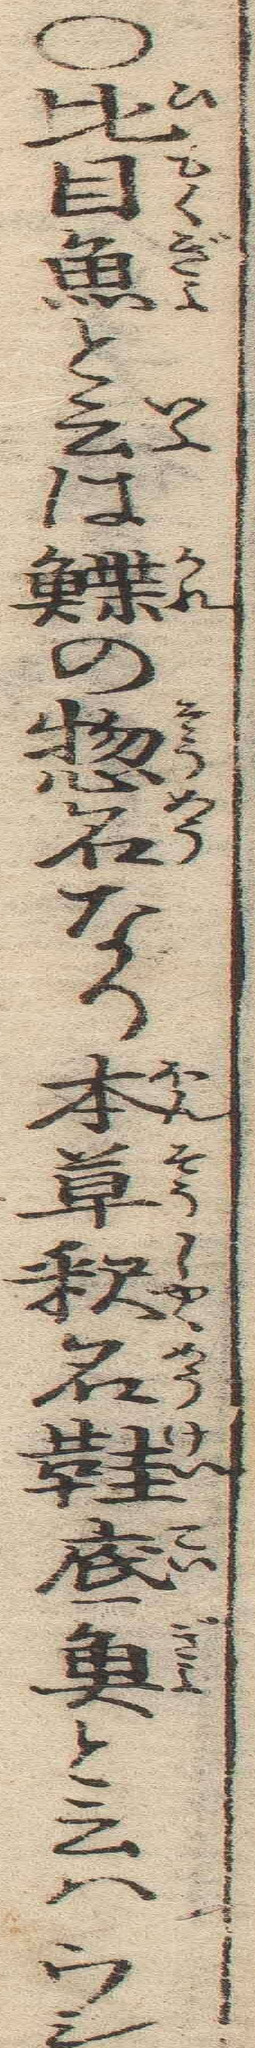○比目魚と云は鰈の惣名なり本草釈名鞋底魚と云はウシ
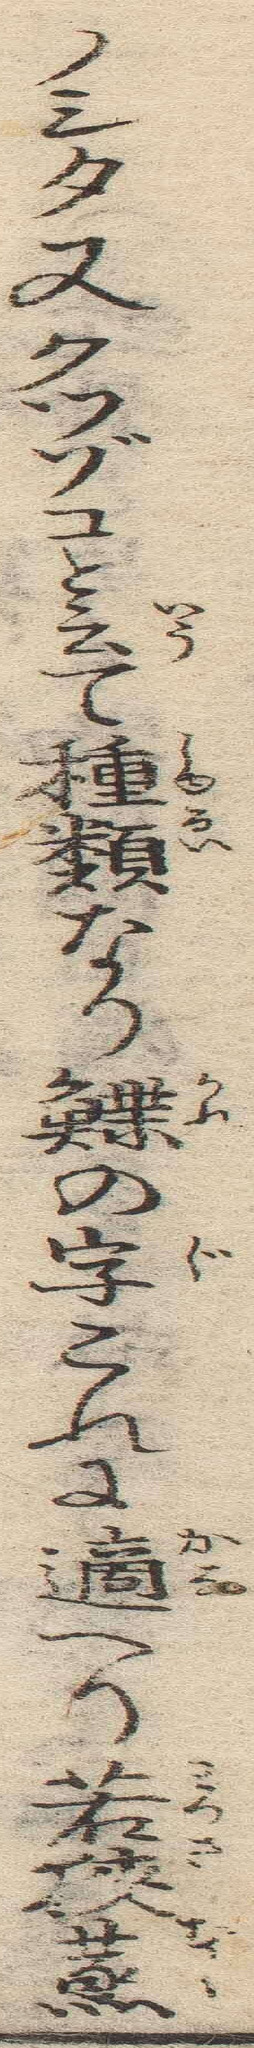ノシタ又クツゾコと云て種類なり鰈の字これに適へり若狭蒸
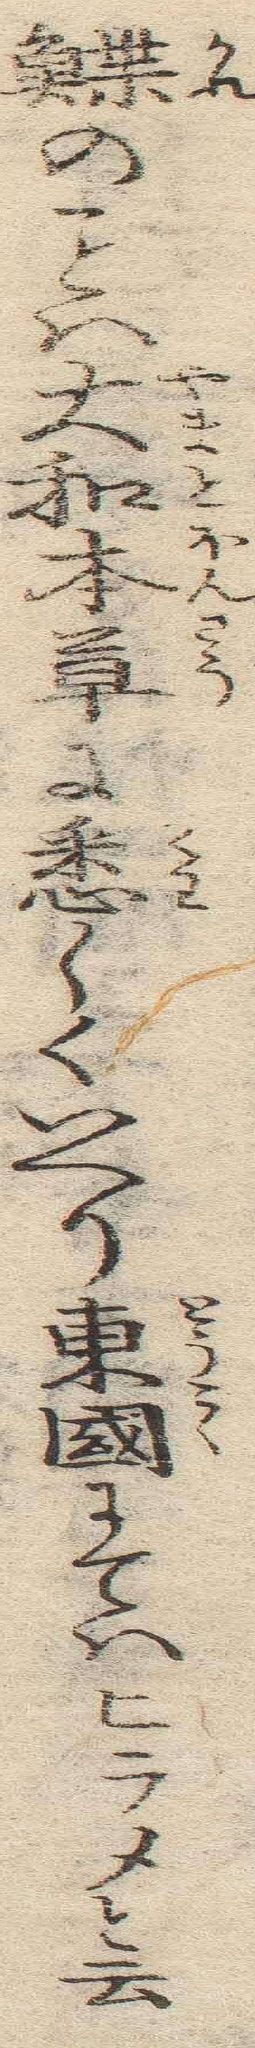鰈のことは大和本草に悉しくいへり東国にてはヒラメと云
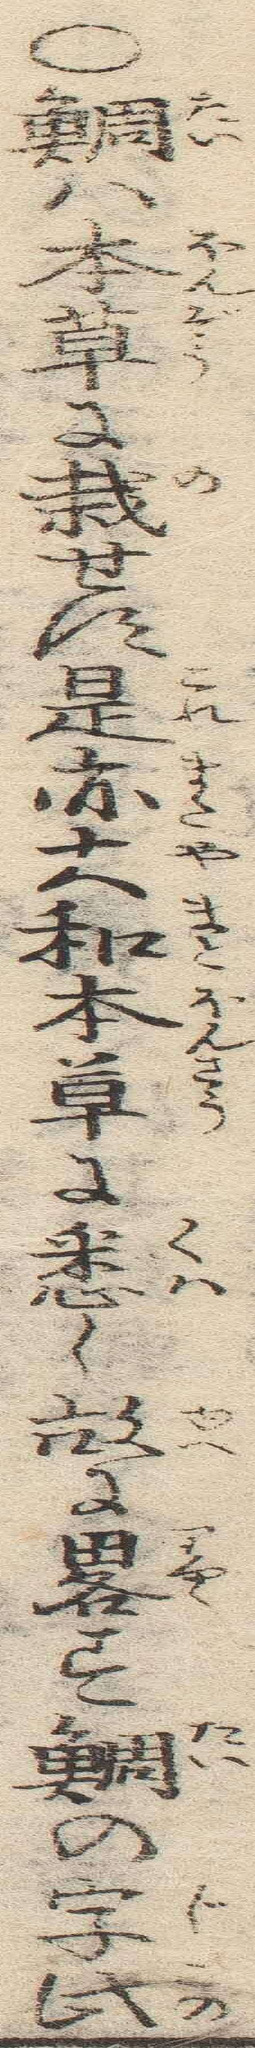○鯛は本草に栽せす是亦大和本草に悉し故に略す鯛の字此
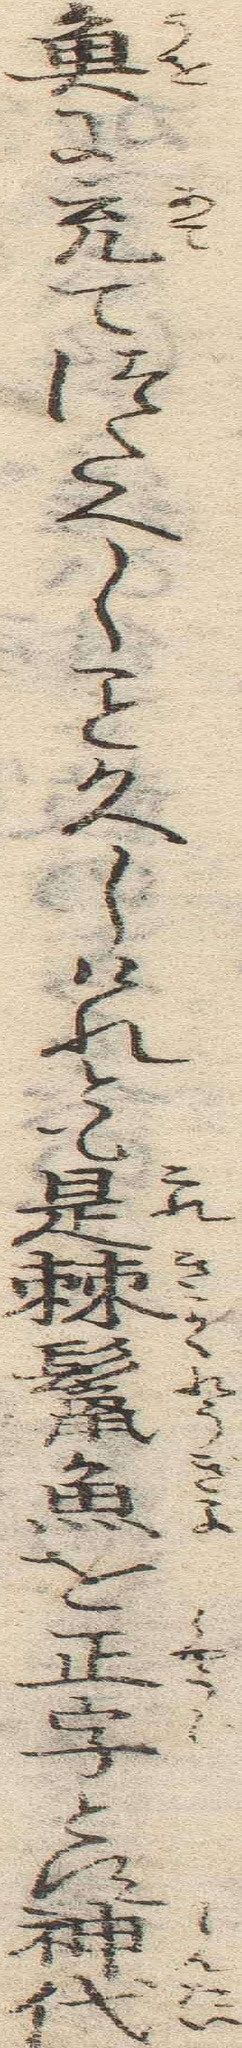魚に充てつたへしこと久しけれとも是棘鬣魚を正字とす神代
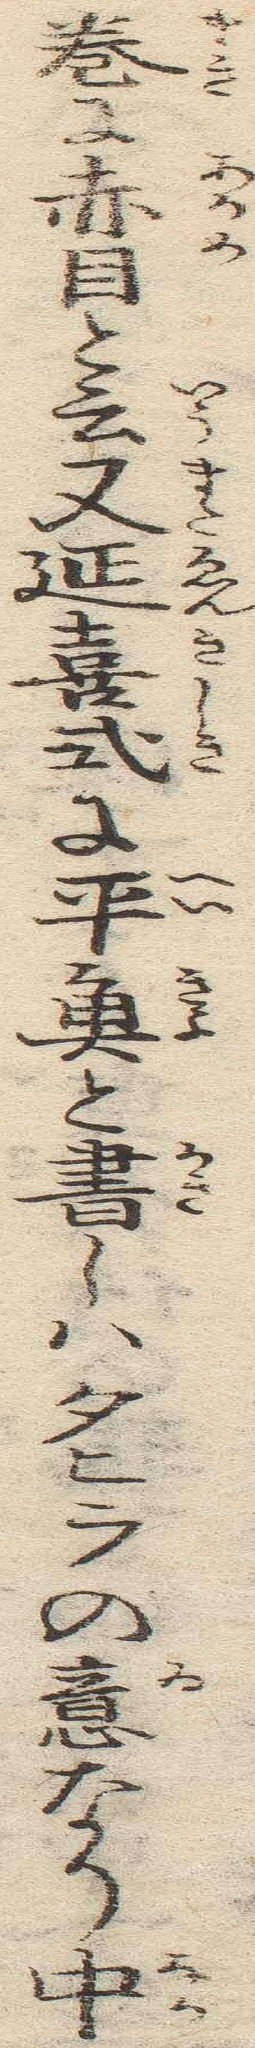巻に赤目と云又延喜式に平魚と書しはタヒラの意なり中
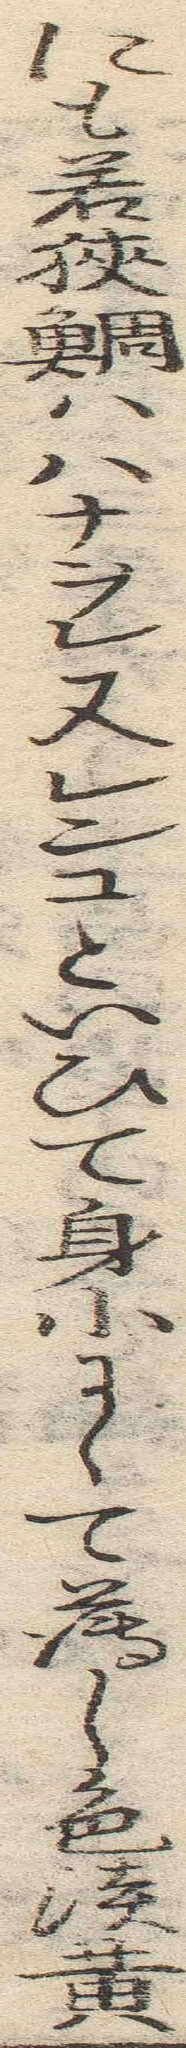にも若狭鯛はハナヲレ又レンコといひて身小にして薄し色淡黄
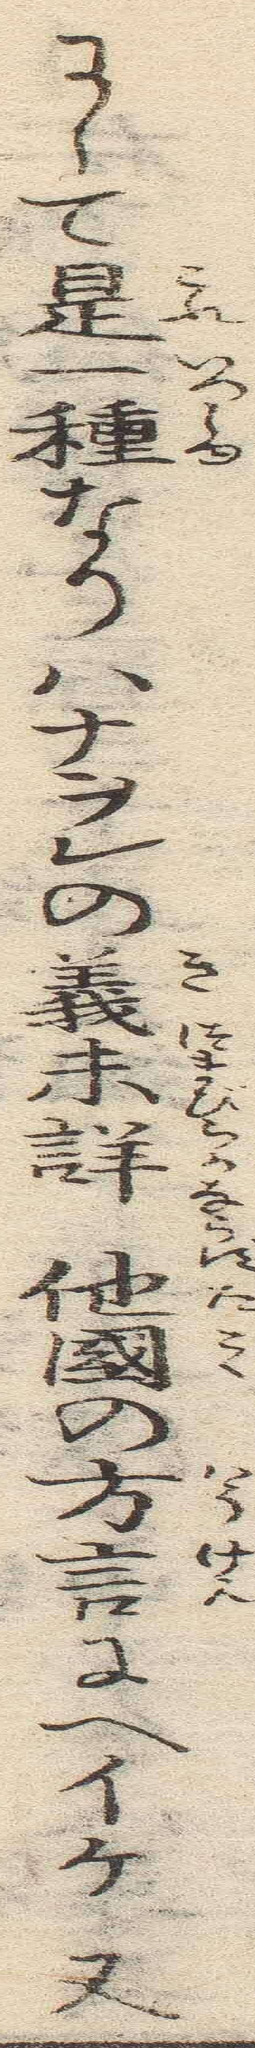にして是一種なりハナヲレの義未詳他国の方言にヘイケ又
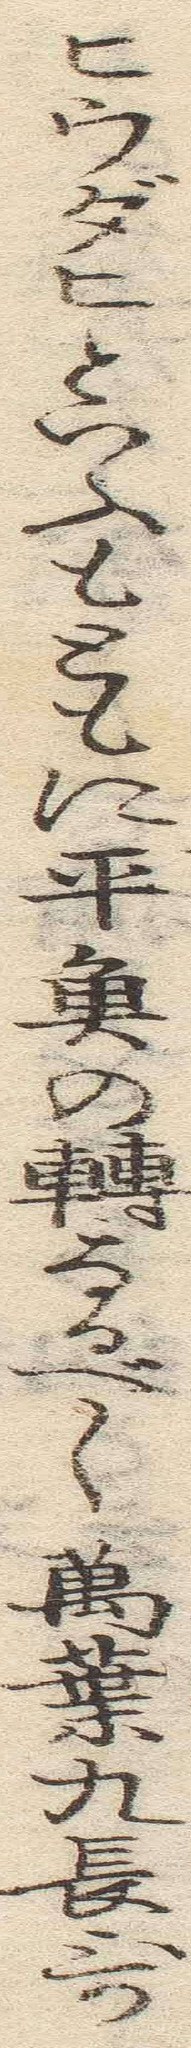ヒウダヒといふもともに平魚の転なるべし万葉九長哥
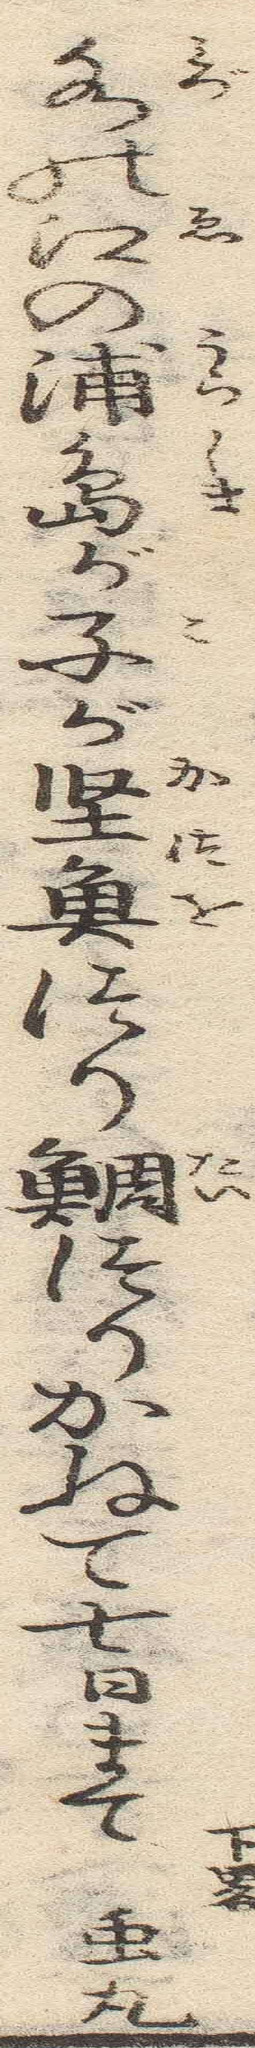水の江の浦島が子が堅魚つり鯛つりかねて七日まて下略虫丸
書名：日本山海名産図会
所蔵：東京学芸大学附属図書館 国文学研究資料館
